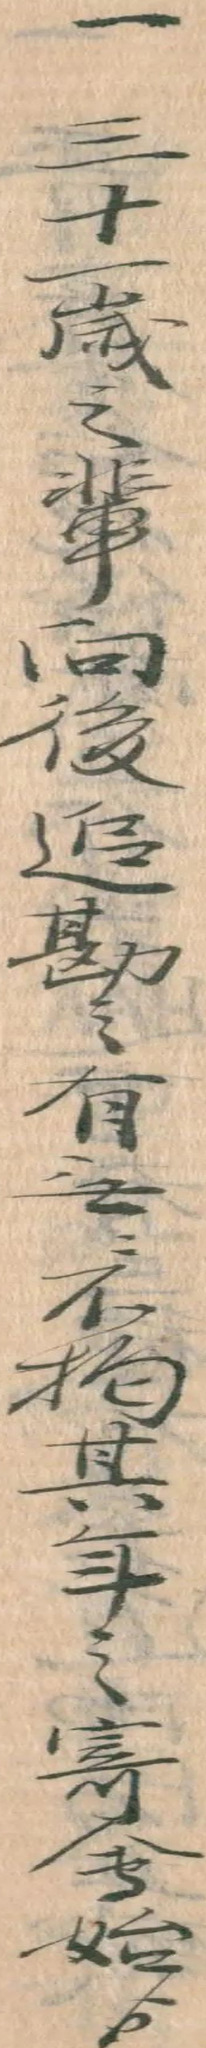一三十一歳之輩向後追勘之有無ニ不拘其年之寄會始ゟ
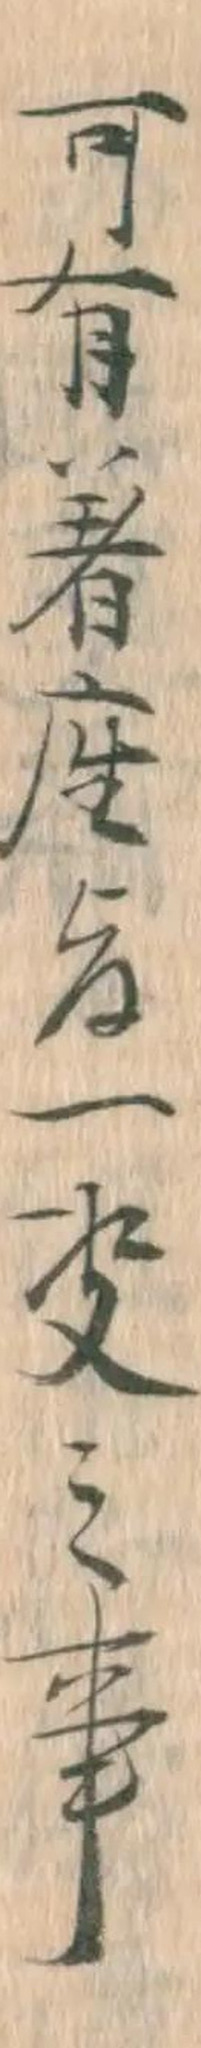可有着座旨一決之事
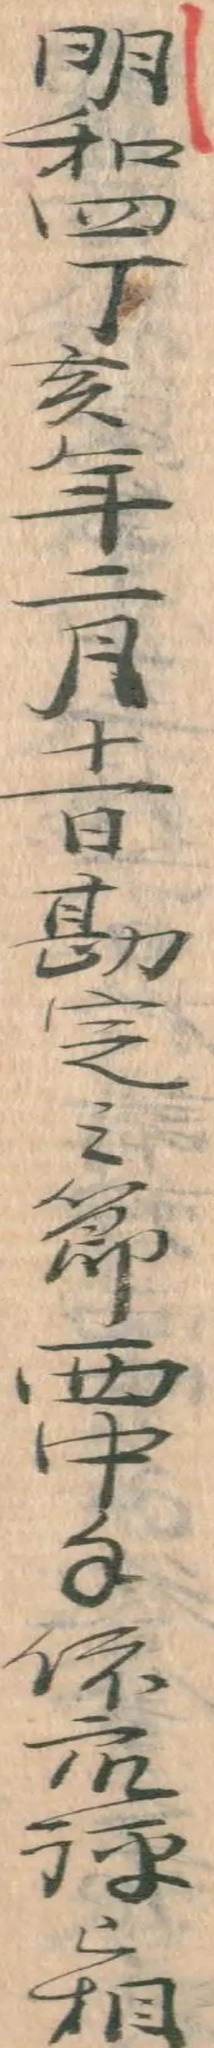明和四丁亥年二月十一日勘定之節西中手依衆評被相
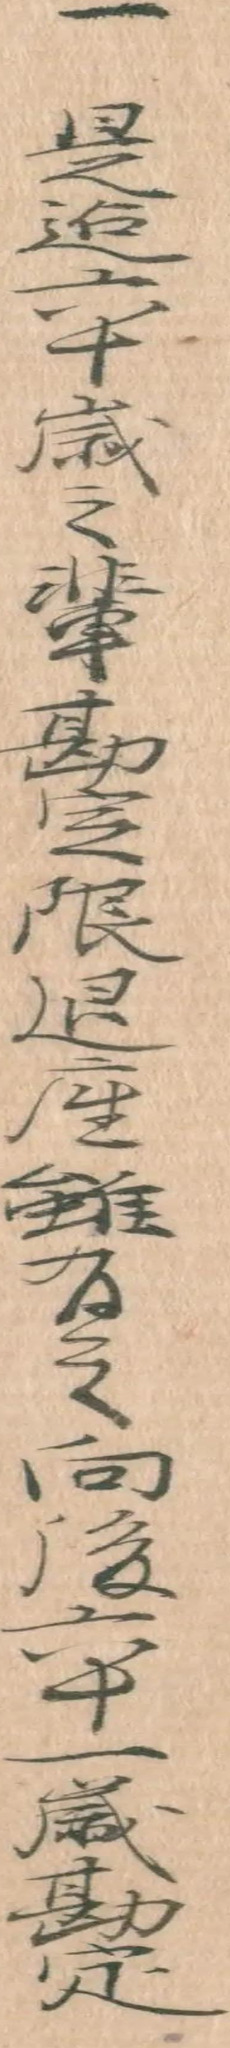一是迄六十歳之輩勘定限退座雖有之向後六十一歳勘定
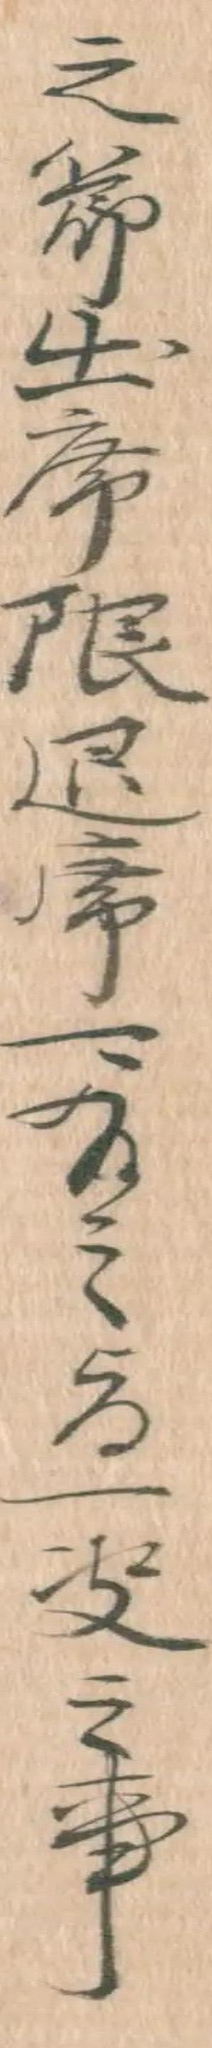之節出席限退席可有之旨一決之事
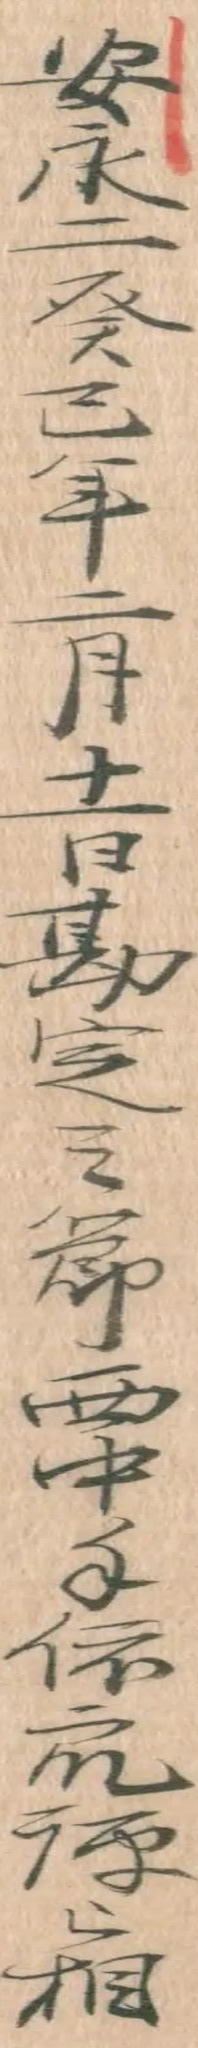安永二癸巳年二月十一日勘定之節西中手依衆評被相
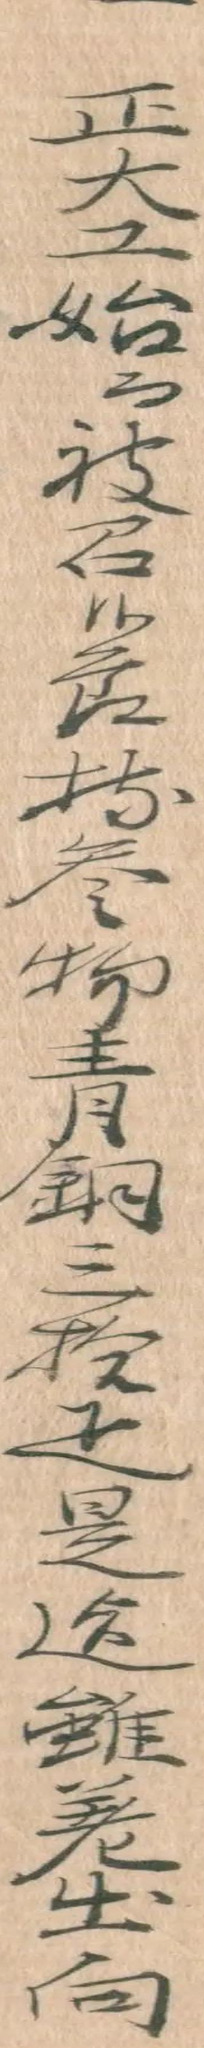一正大工始而被召候節持参物青銅三拾疋是迄雖差出向
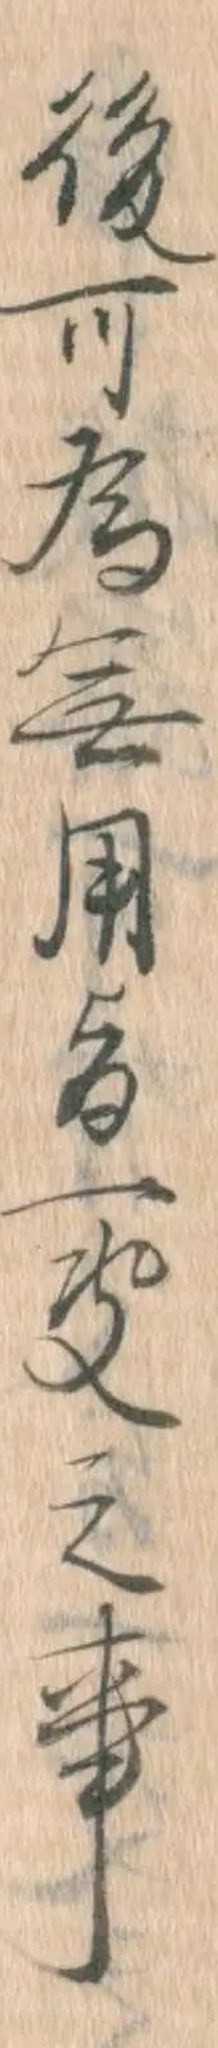後可為無用旨一決之事
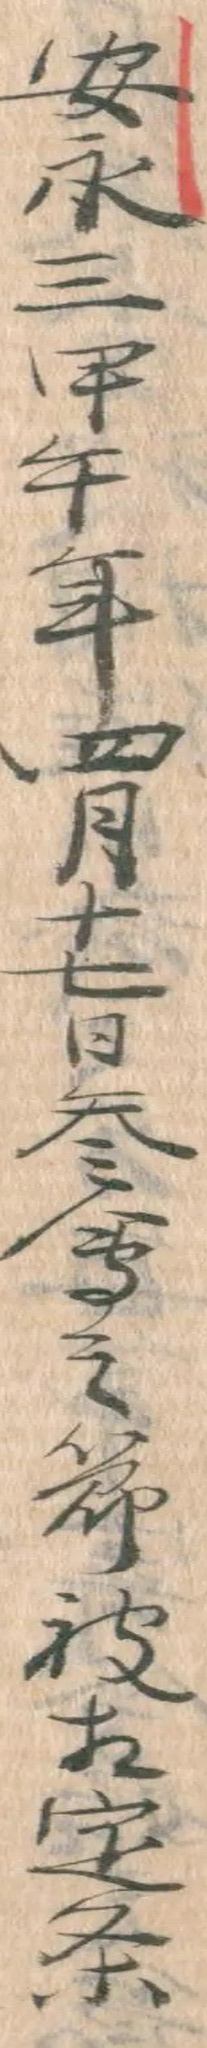安永三甲午年四月十七日参會之節被相定条
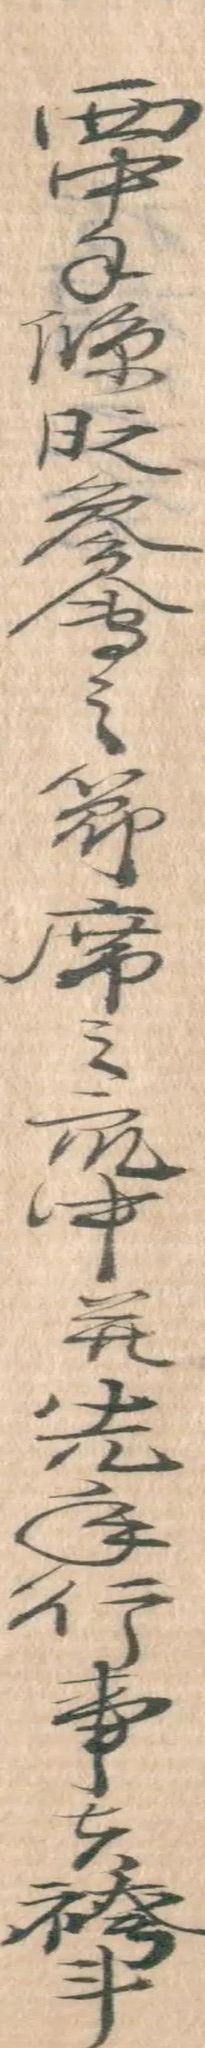一西中手臨時参會之節席之衆中并先年行事は袴斗
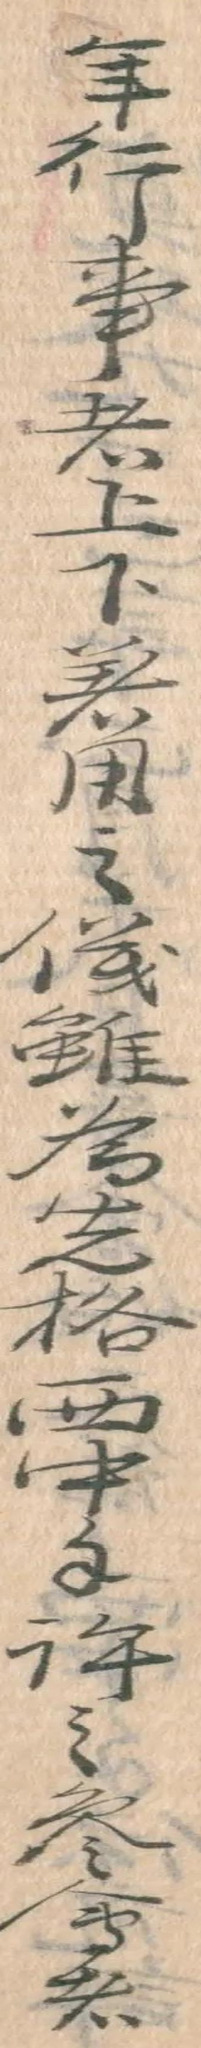年行事者上下着用之儀雖為先格西中手許之参會者
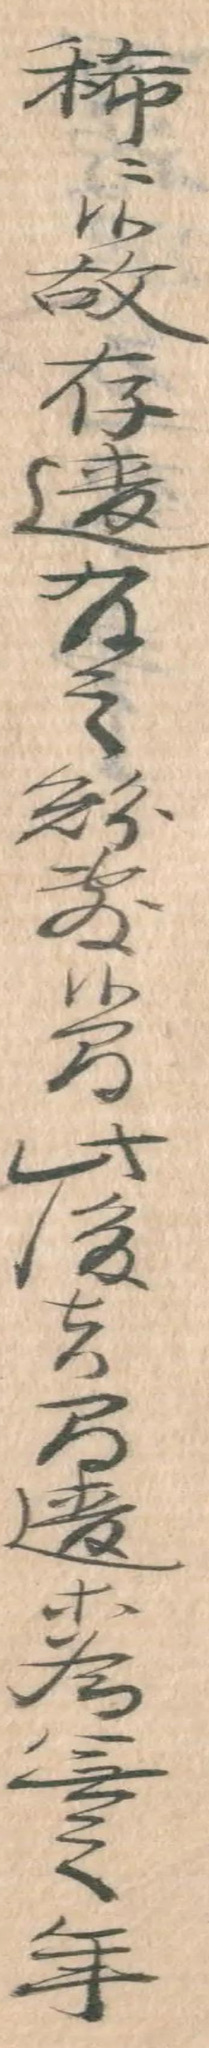稀ニ候故存違有之紛敷候間此後は間違等為無之年
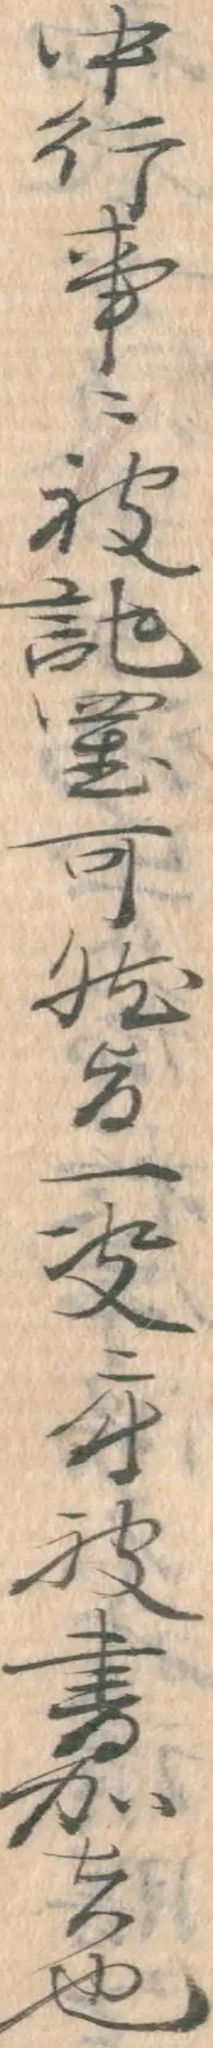中行事に被記置可然旨一決ニ付被書加者也
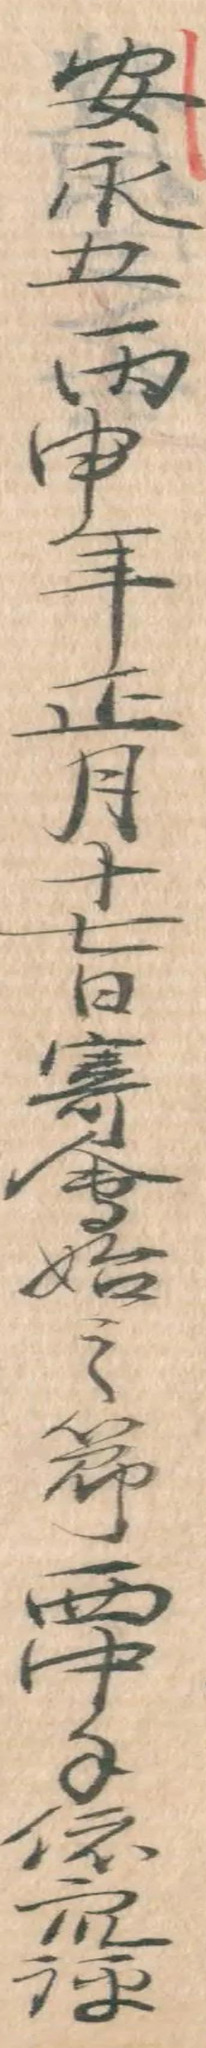安永五丙申年正月十七日寄會始之節西中手亦衆評

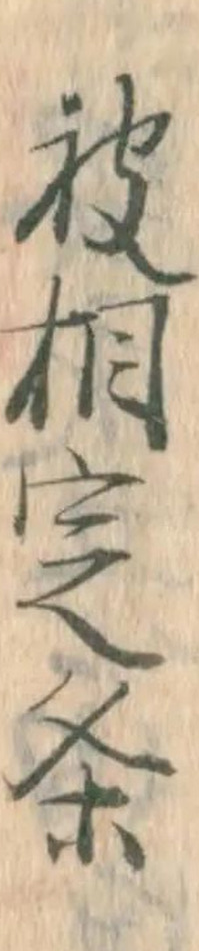被相定条
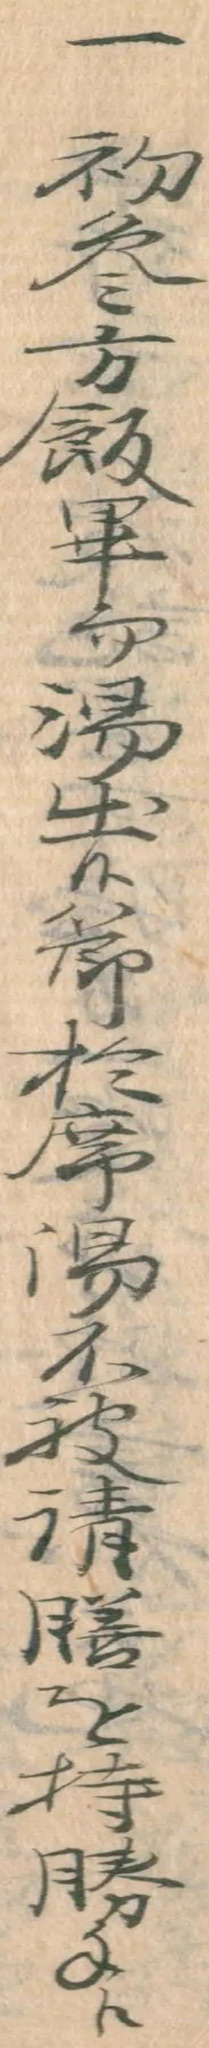一初参方飯畢而湯出候節於席湯不被請膳を持勝手え
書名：賀茂社記録. 第29冊
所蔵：国立国会図書館 National Diet Library, JAPAN
